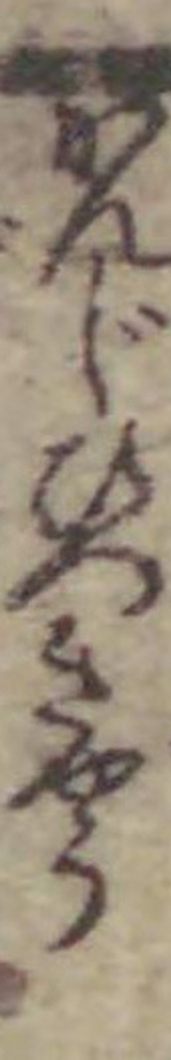かんじひつきやう
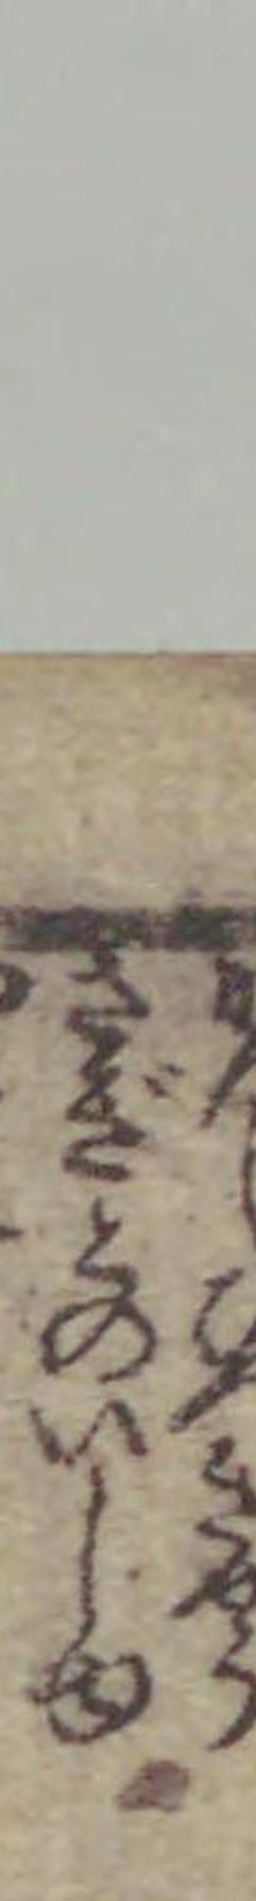さぎとのいしゆ
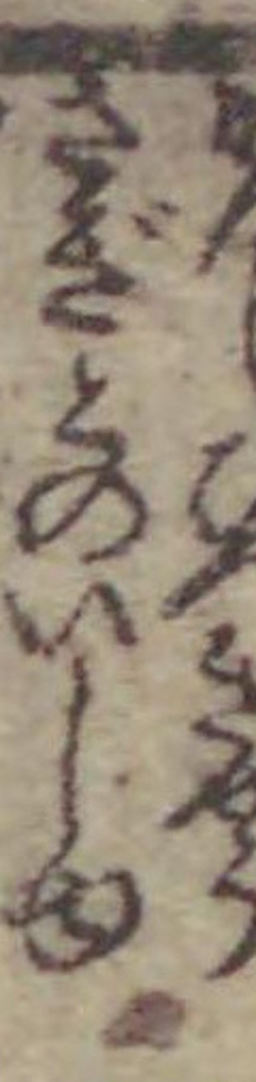さぎとのいしゆ
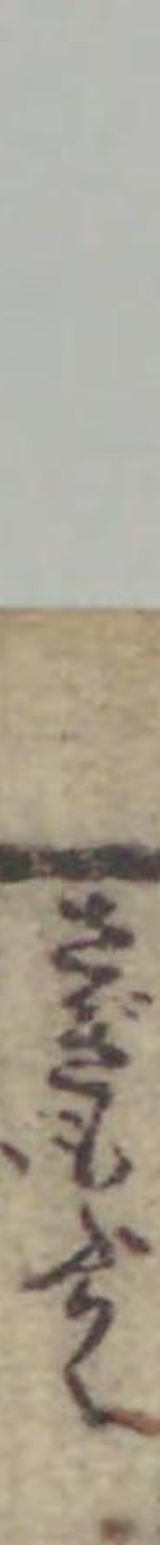さぎもふかく
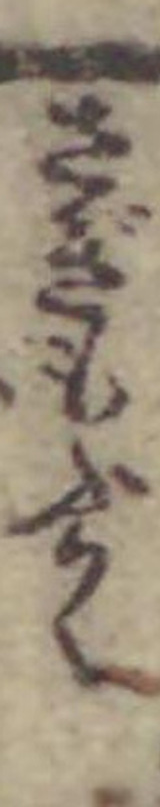さぎもふかく
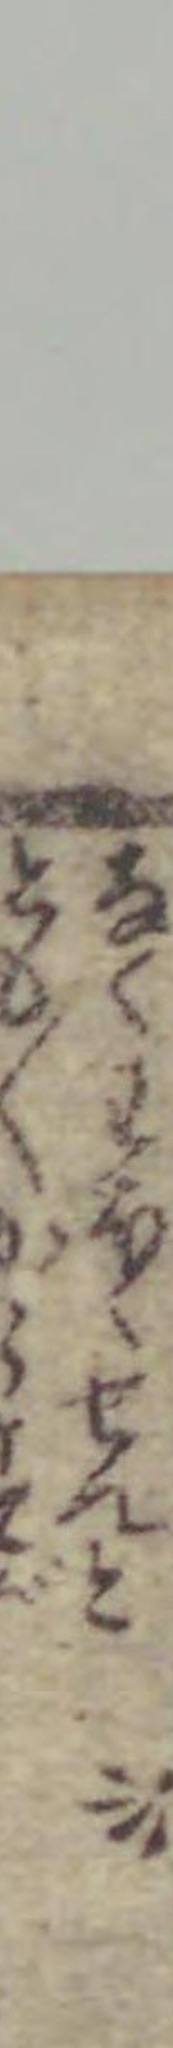なくわほくせんと
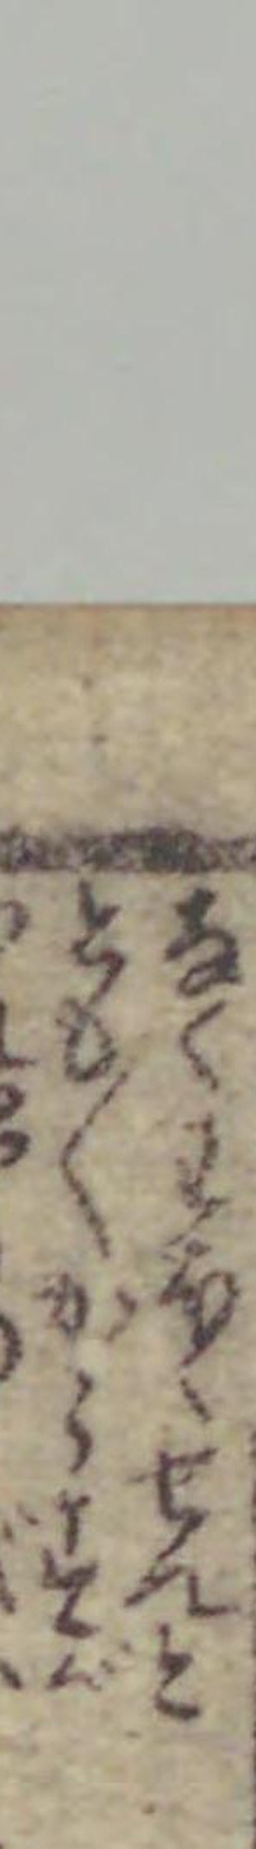とも〳〵からすが
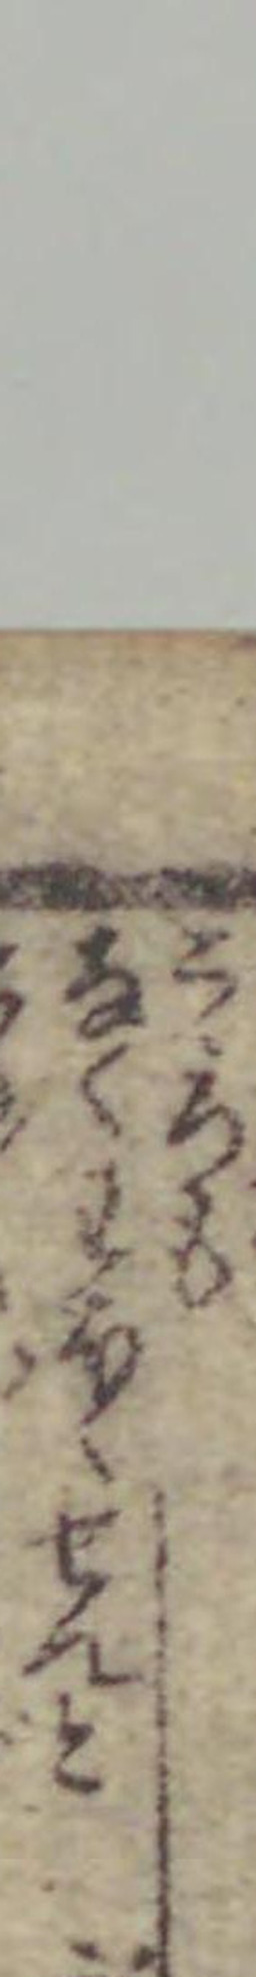なくわほくせんと
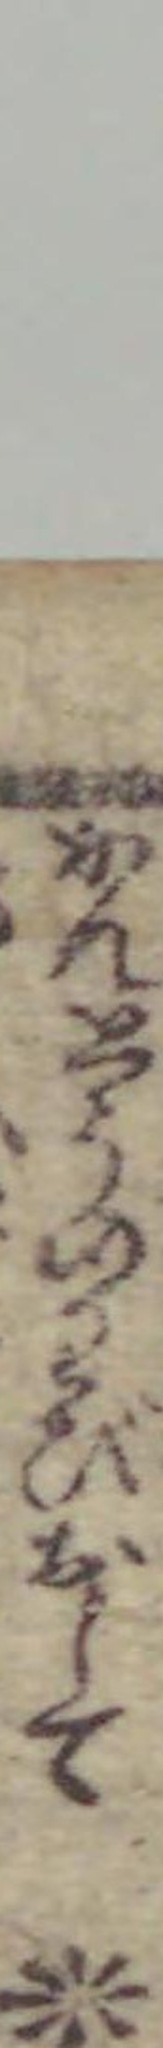かんとうのわびをして
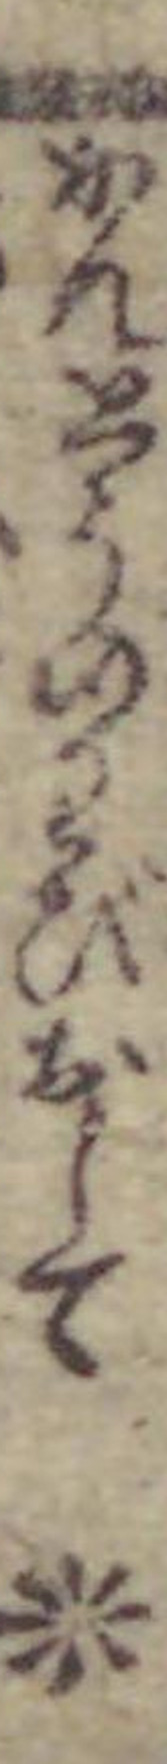かんとうのわびをして
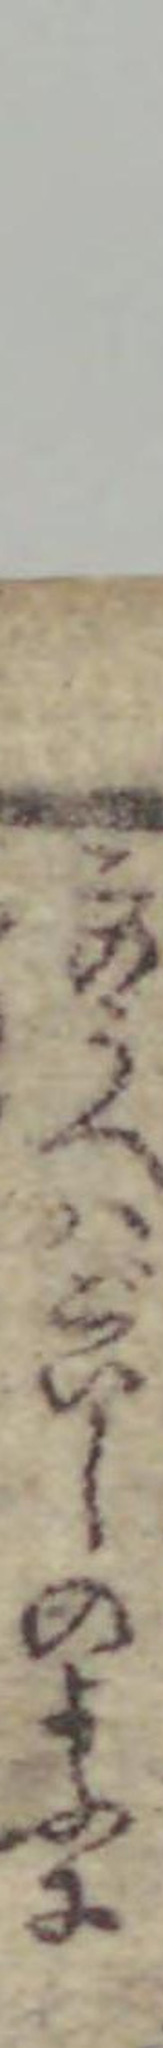このうへはごいしのよふに
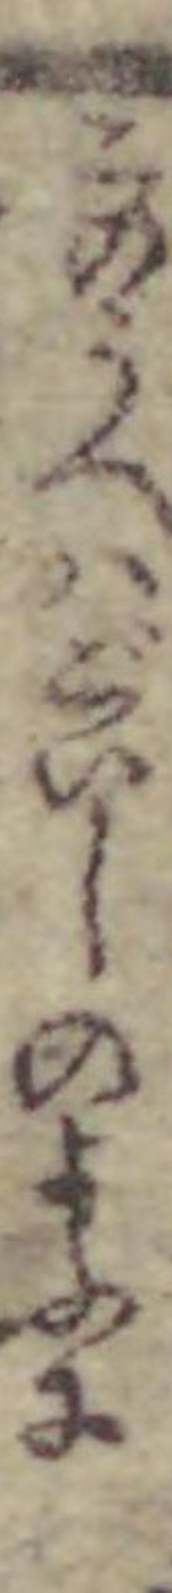このうへはごいしのよふに
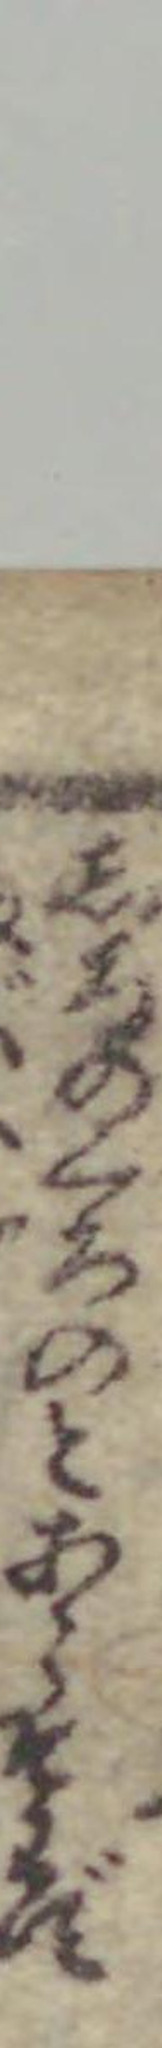しのくろのとあらそわず
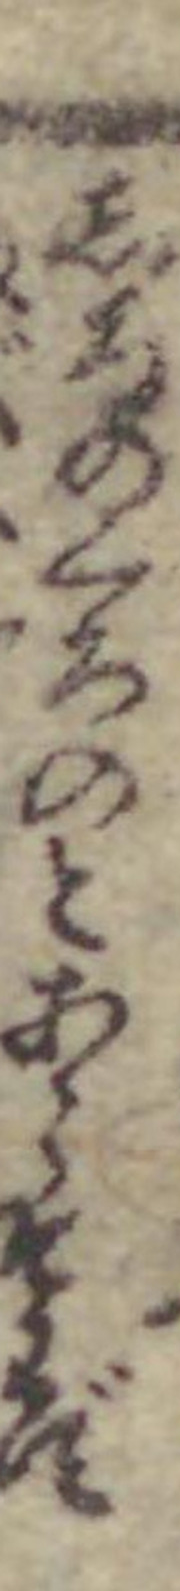しのくろのとあらそわず
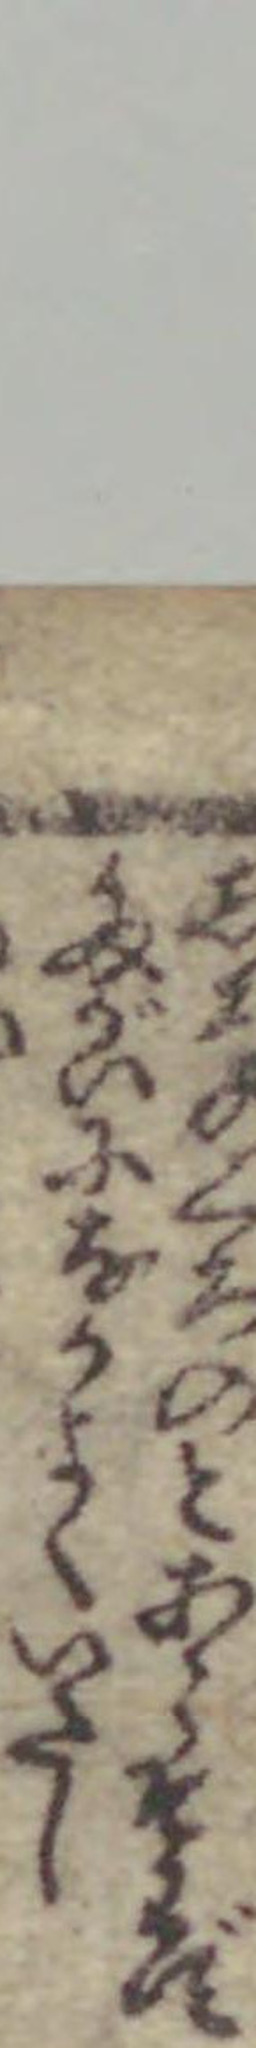たがいになかよくいたし
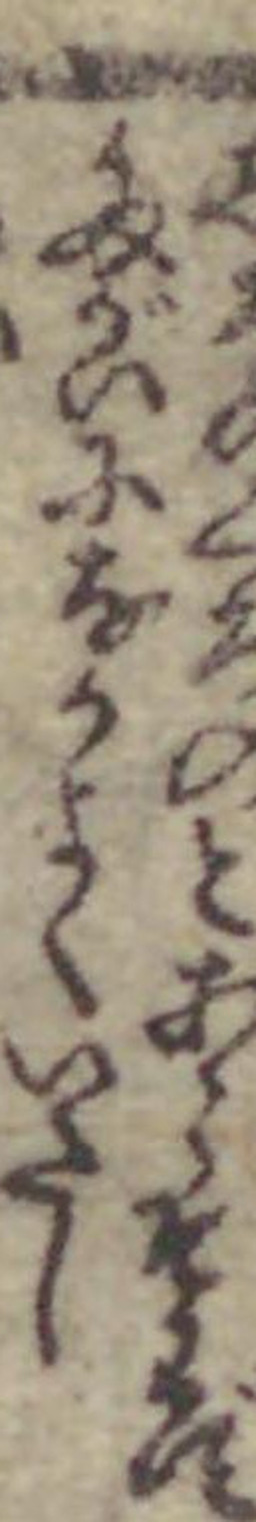たがいになかよくいたし
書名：烏行水諺草 3巻
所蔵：国立国会図書館 National Diet Library, JAPAN
